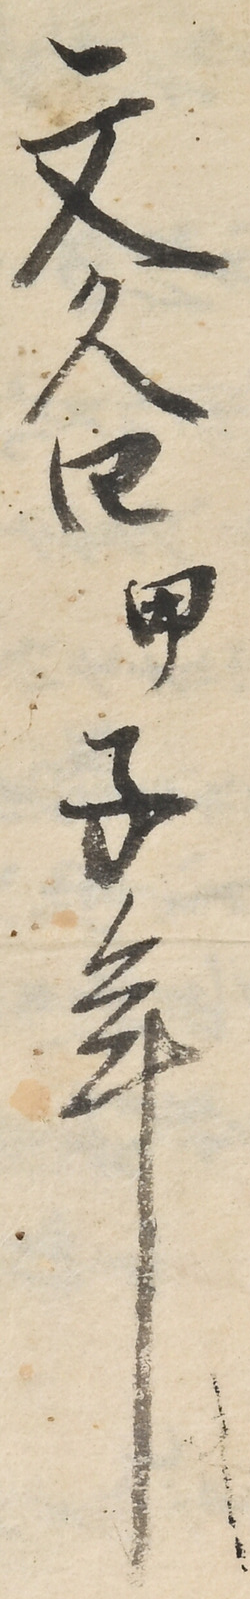文久四甲子年
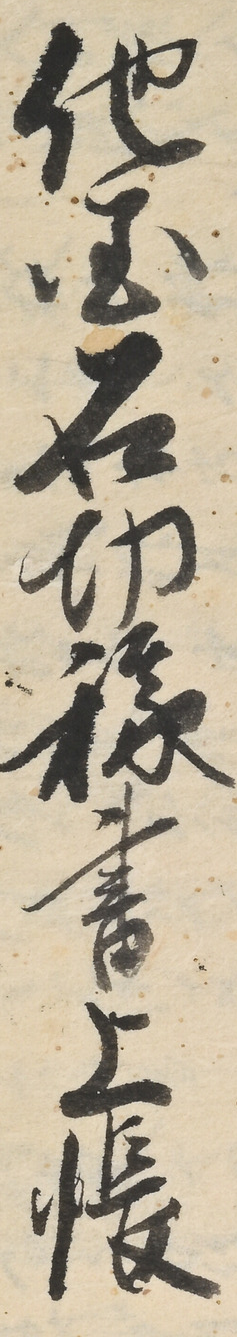他国石切稼書上帳
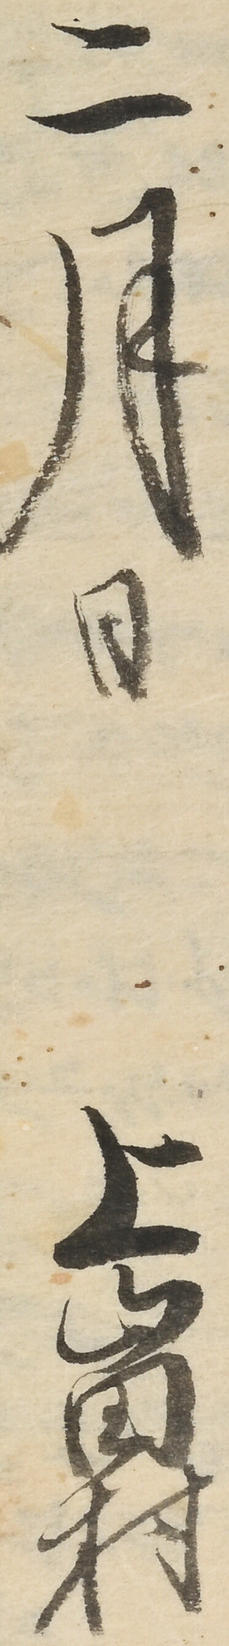二月日上山田村

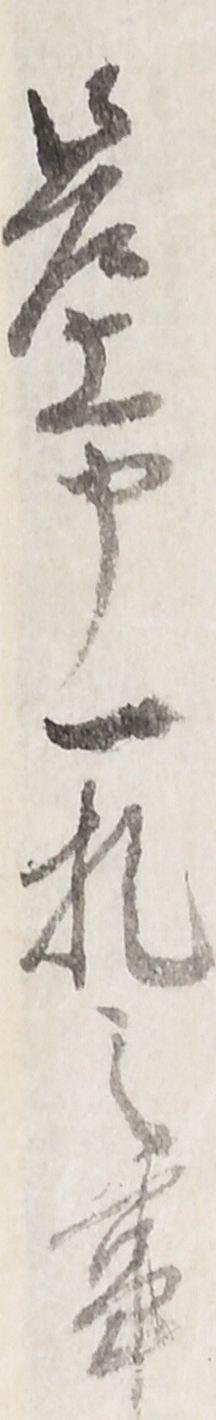差上申一札之事
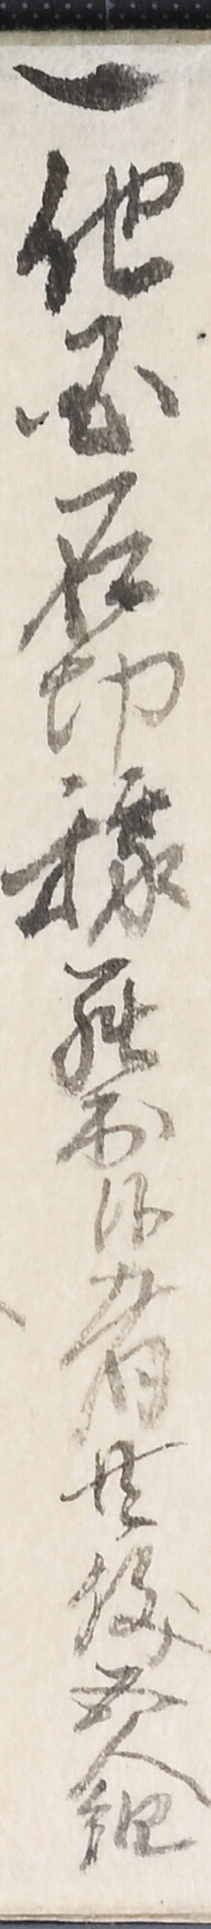一他国石切稼罷出候者共儀五人組
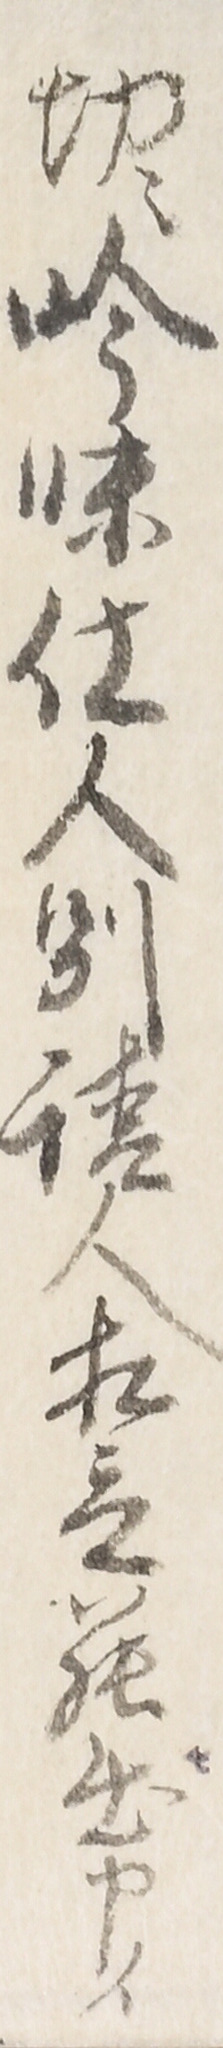切ニ吟味仕人別請人相立罷出申候
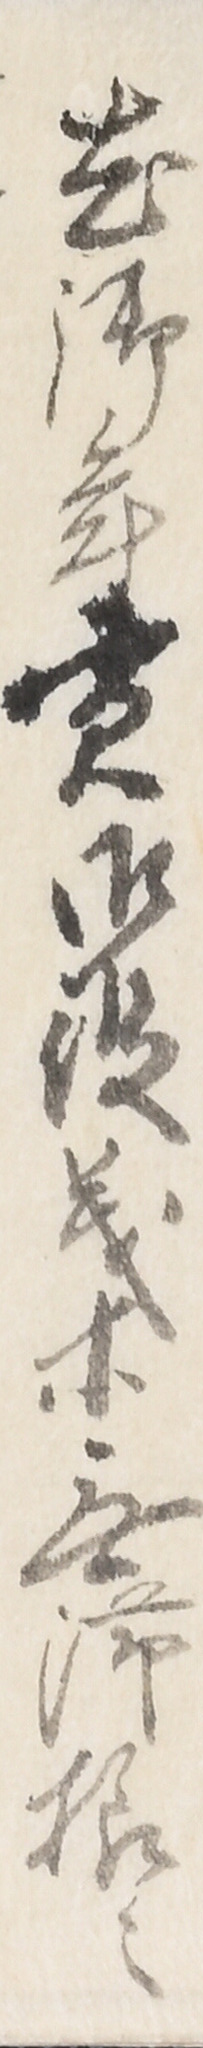尤御年貢御役義等無滞様ニ
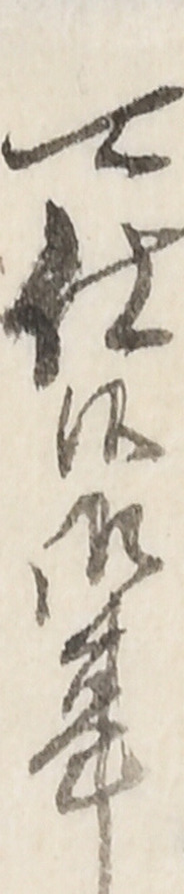可仕候御事
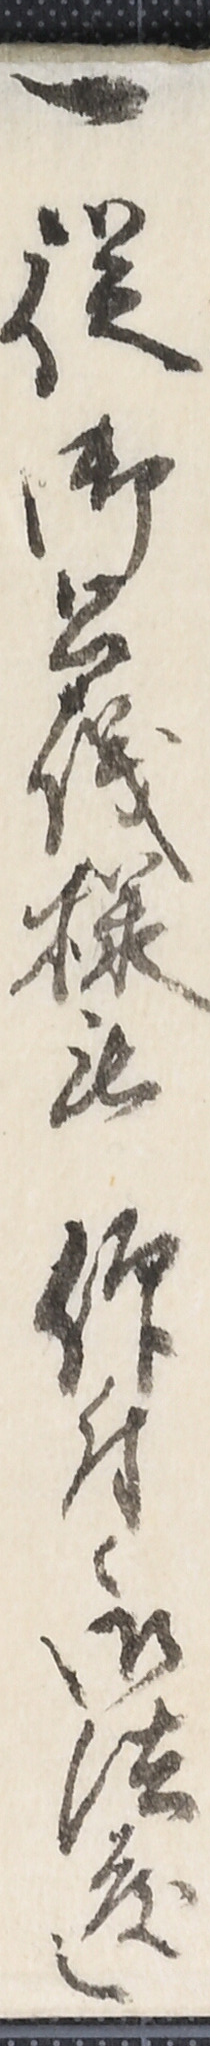一従御公儀様被仰付候御法度之
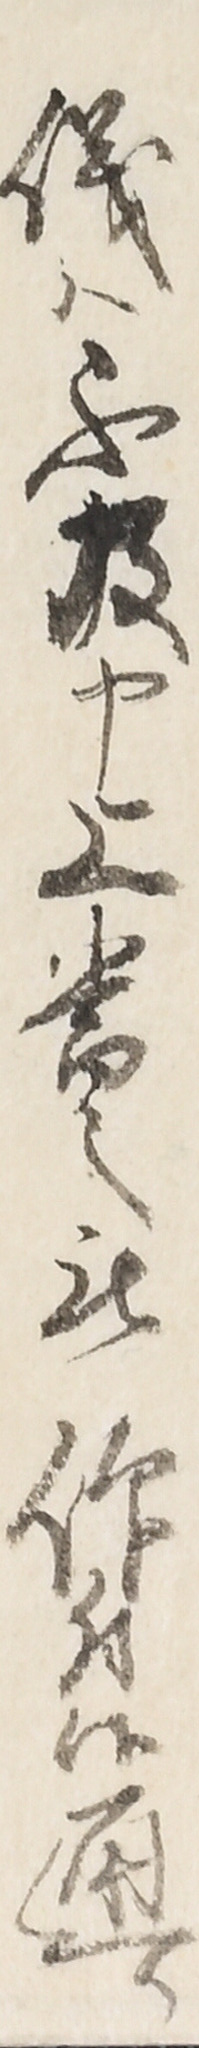儀ハ不及申上常々被仰付候通り
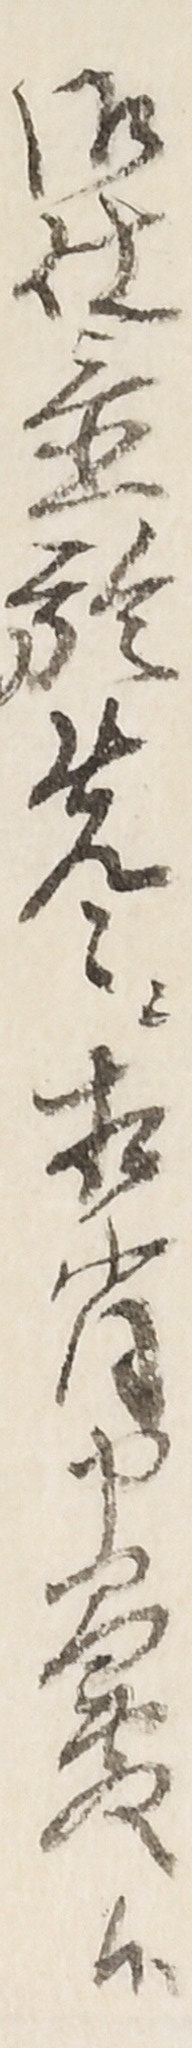御仕置於先々ニ相背申間敷候
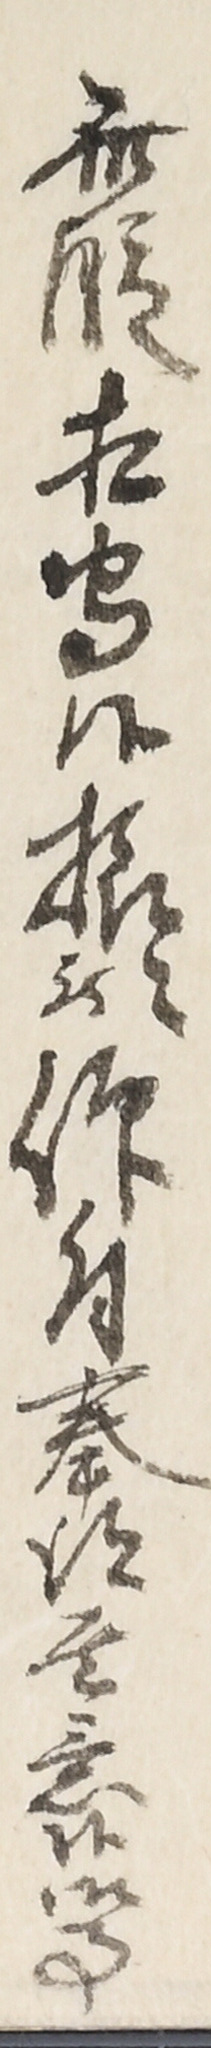此段相守候様ニ被仰付奉得其意候御事
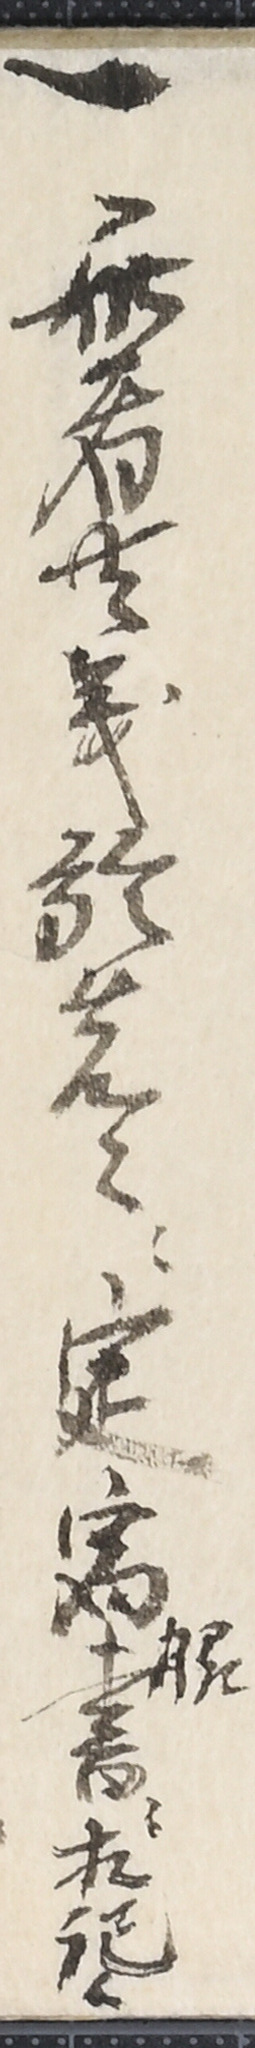一此者共義於先々ニ定宿脇書ニ相記候
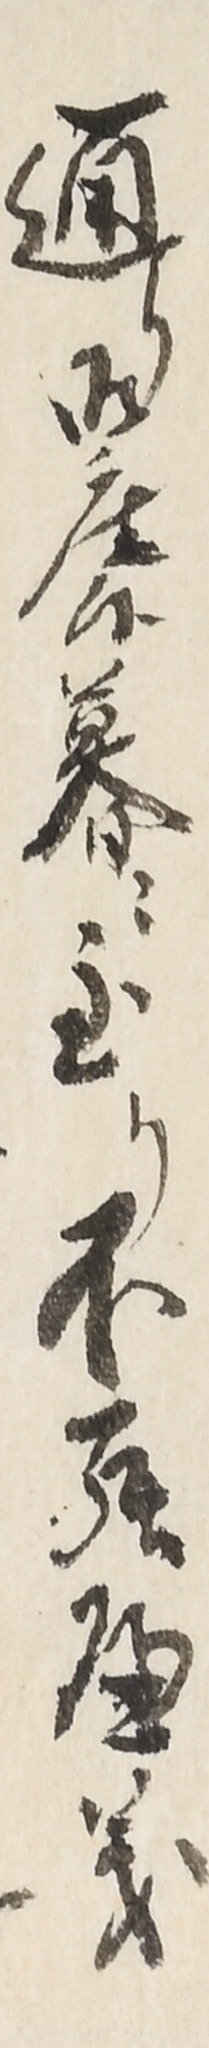通り御座候暮ニ至り不罷帰義
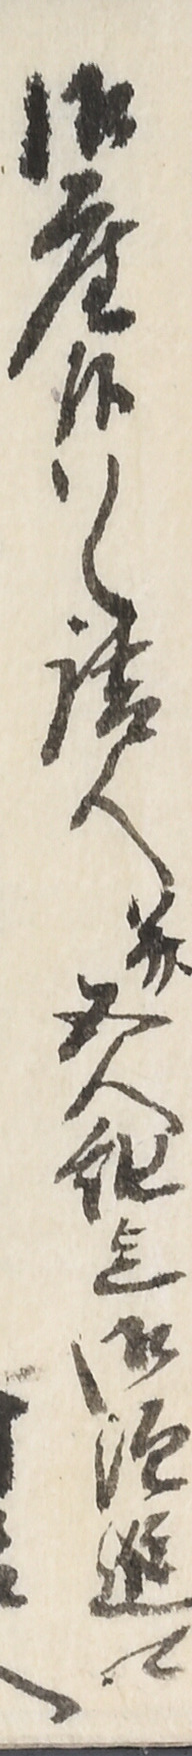御座候ハゝ請人幷五人組迄御注進可
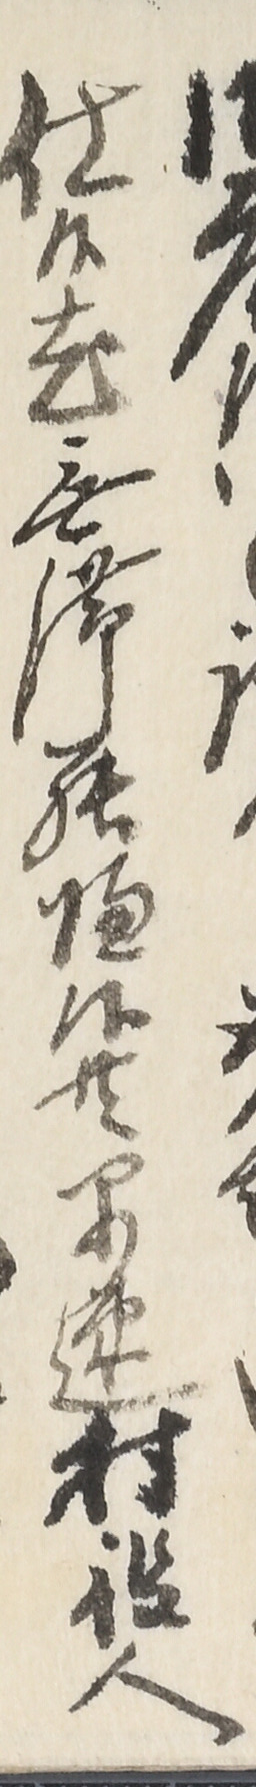仕候尤無滞罷帰候共早速村役人
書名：文久四甲子年二月日他国石切稼書上帳
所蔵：伊那市立高遠町図書館・合同会社AMANE
